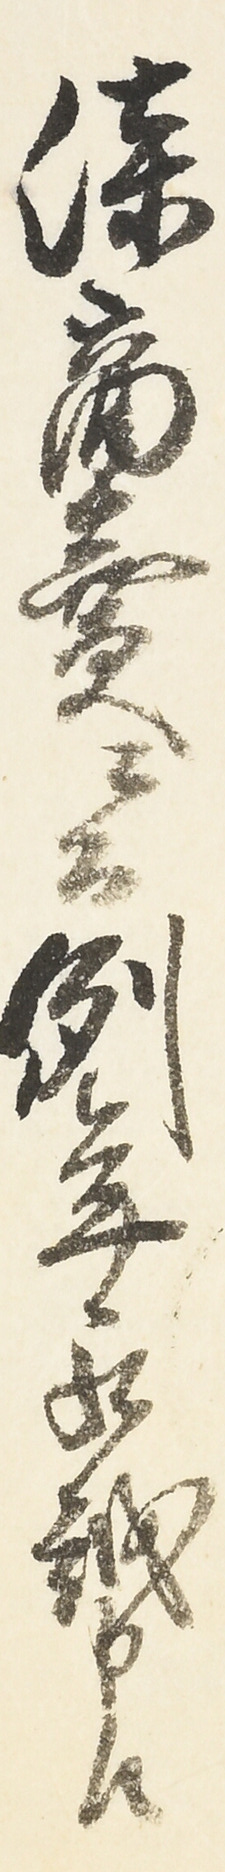漆商売ニ而例年罷越申候
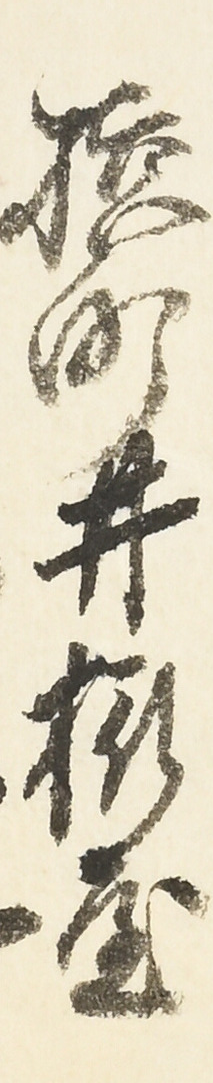横町井桁屋
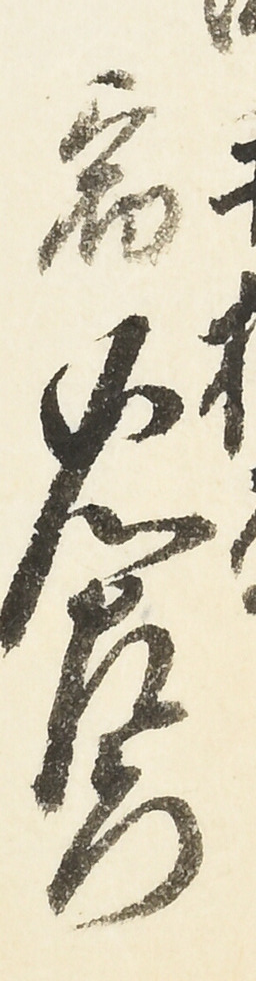宿忠左衛門

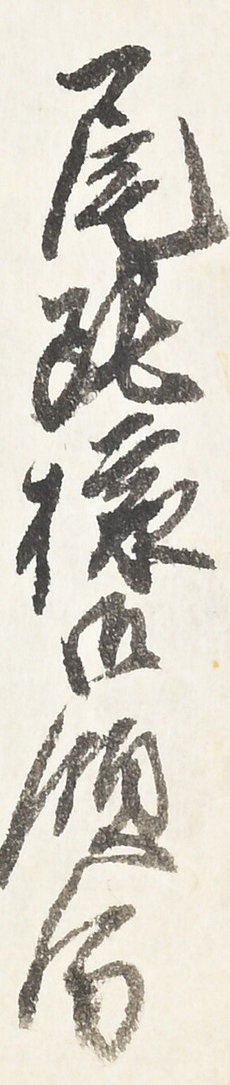尾張様御領分
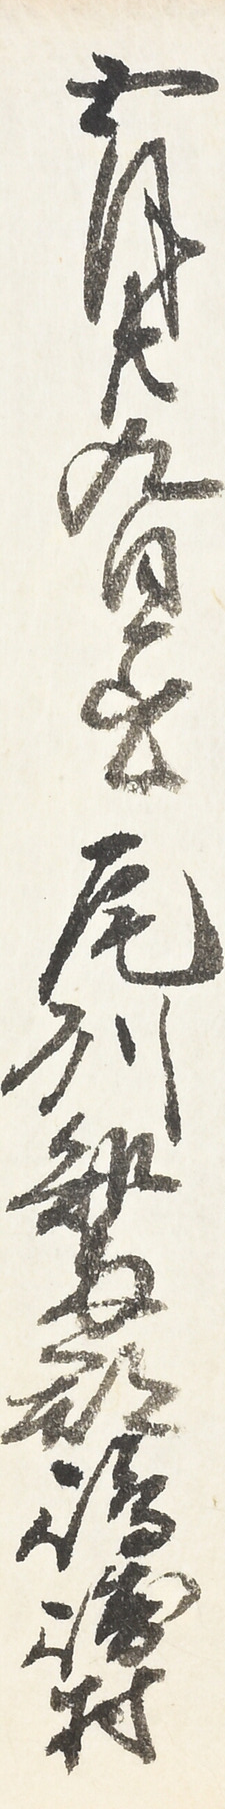五月廿九日着尾州知多郡嶋崎村
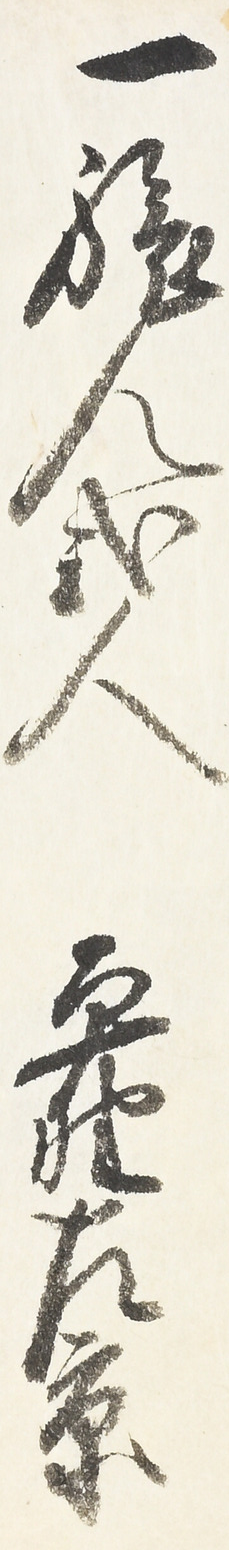一旅人弐人平野左京
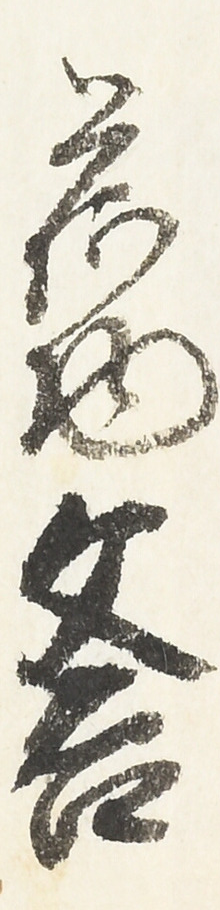荷物文吉
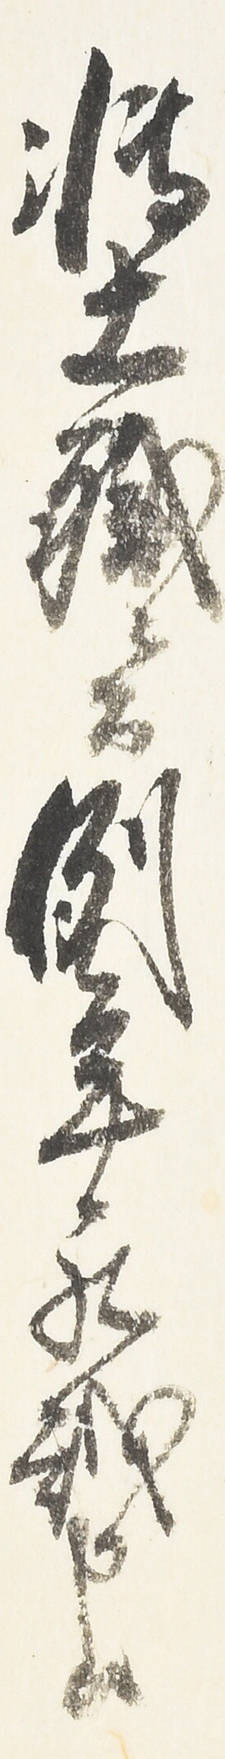転士職ニ而例年罷越申候
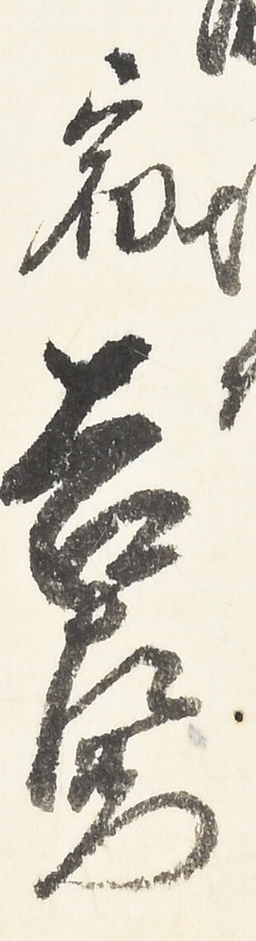宿吉左衛門
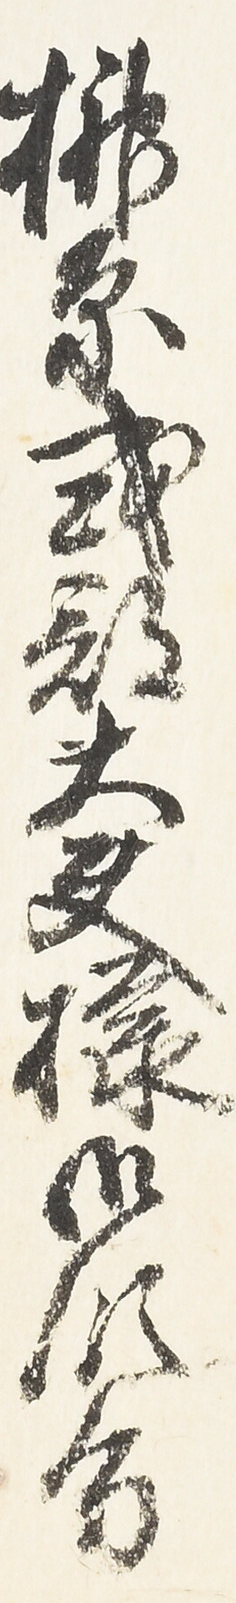榊原式部大夫様御領分
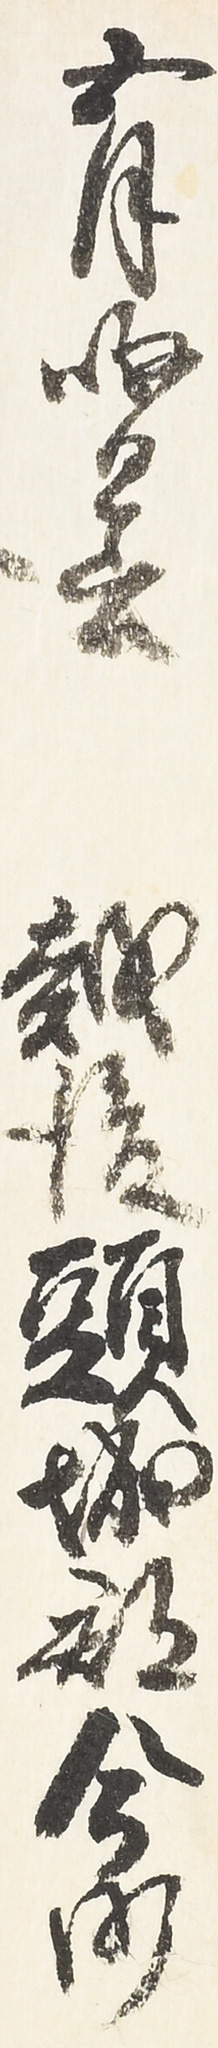五月晦日着越後頸城郡今町
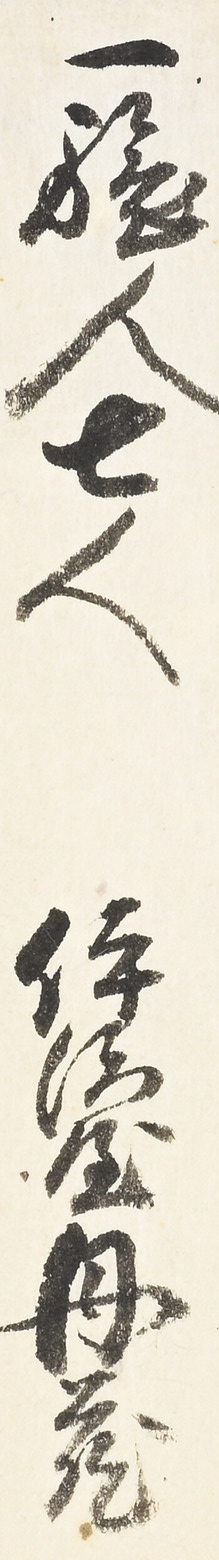一旅人七人伊沢屋丹蔵
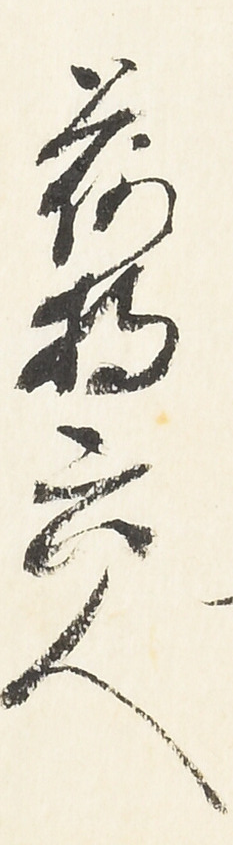荷持六人
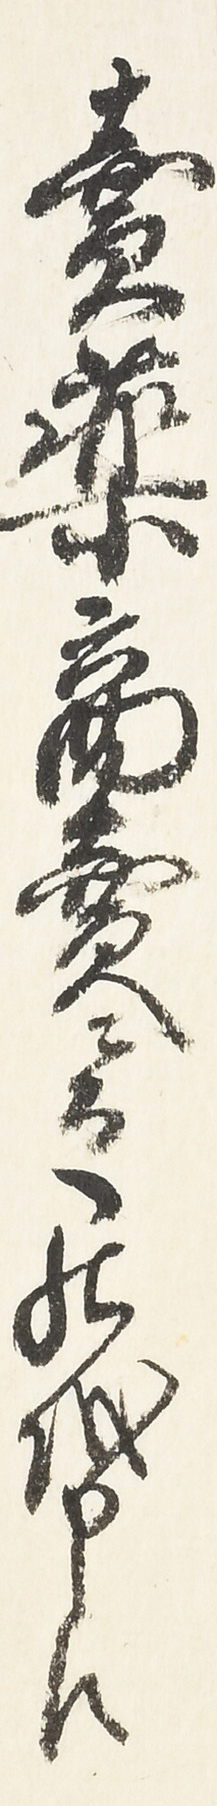売薬商売ニ而罷越申候
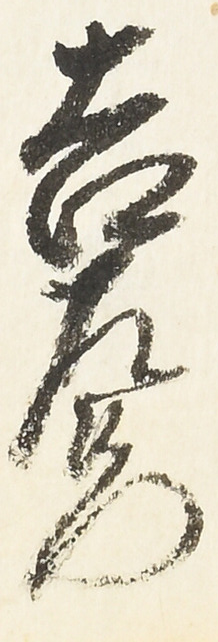宿吉左衛門
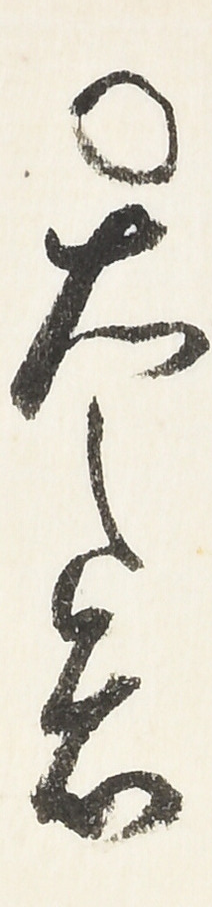〇右之者
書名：町中旅人泊控帳
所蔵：伊那市立高遠町図書館・合同会社AMANE
